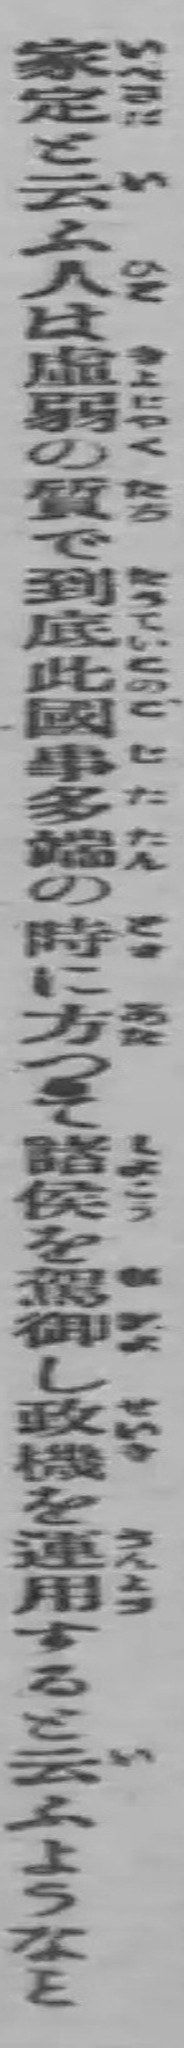家定と云ふ人は虚弱の質で到底此国事多端の時に方つて諸侯を駕御し政機を運用すると云ふようなこと
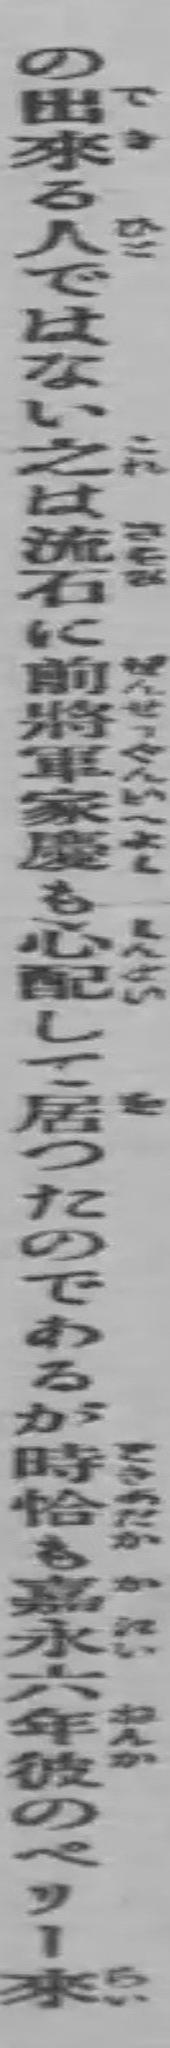の出来る人ではない之は流石に前将軍家慶も心配して居つたのであるが時恰も嘉永六年彼のペリー来
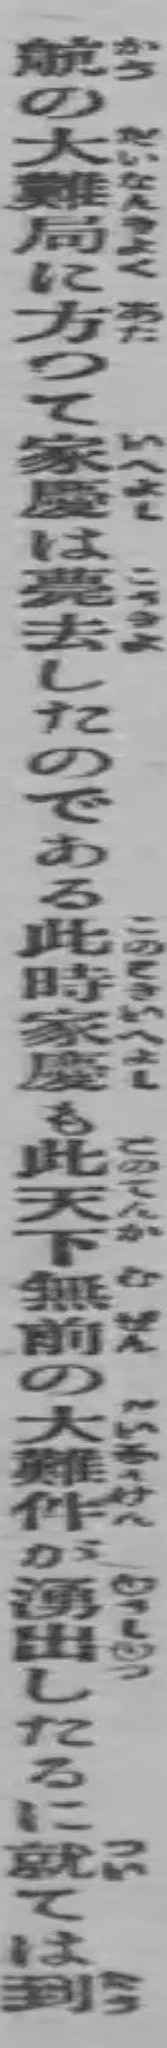航の大難局に方つて家慶は薨去したのである此時家慶も此天下無前の大難件が湧出したるに就ては到
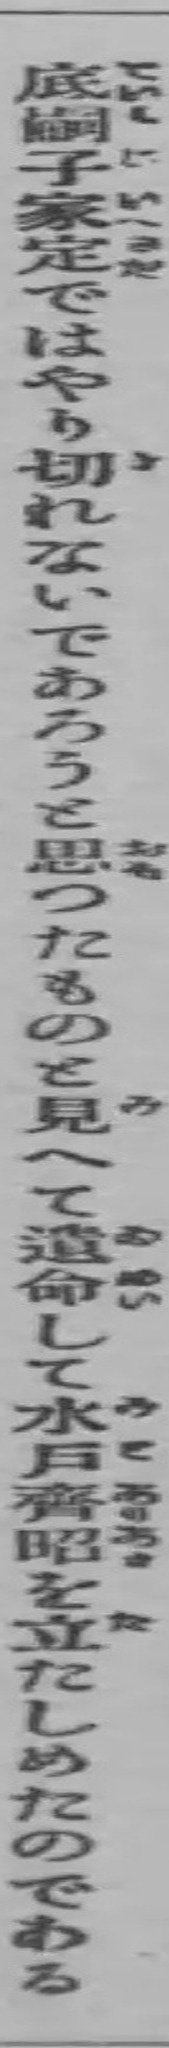底嗣子家定ではやり切れないであろうと思つたものと見へて遺命して水戸斉昭を立たしめたのである
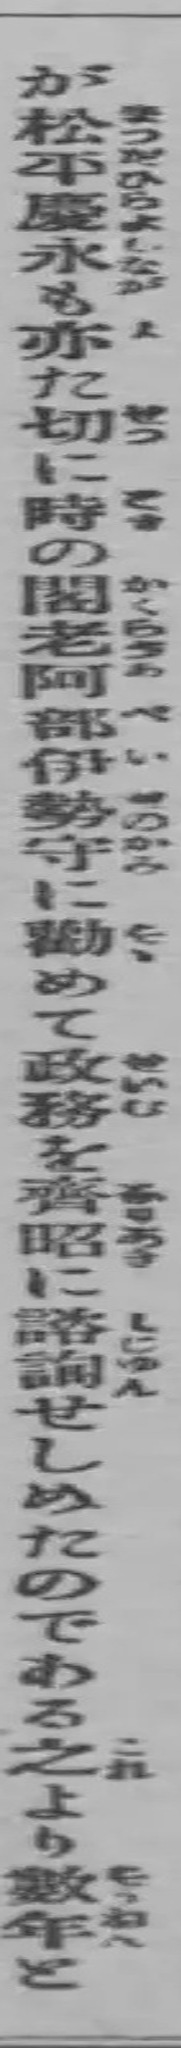が松平慶永も亦た切に時の閣老阿部伊勢守に勧めて政務を斉昭に諮詢せしめたのである之より数年と
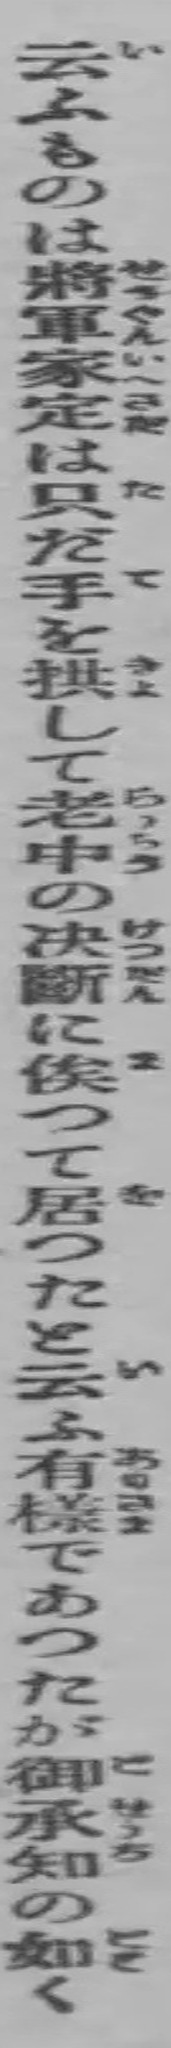云ふものは将軍家定は只だ手を拱して老中の決断に俟つて居つたと云ふ有様であつたが御承知の如く
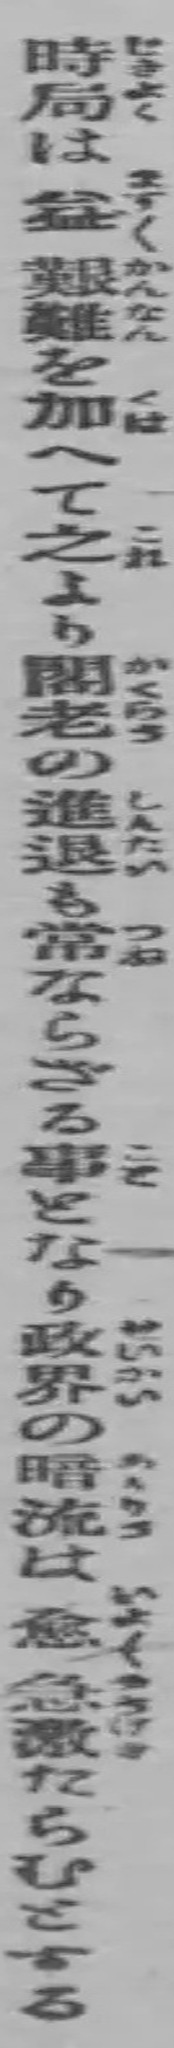時局は益艱難を加へて之より閣老の進退も常ならざる事となり政界の暗流は愈急激たらむとする
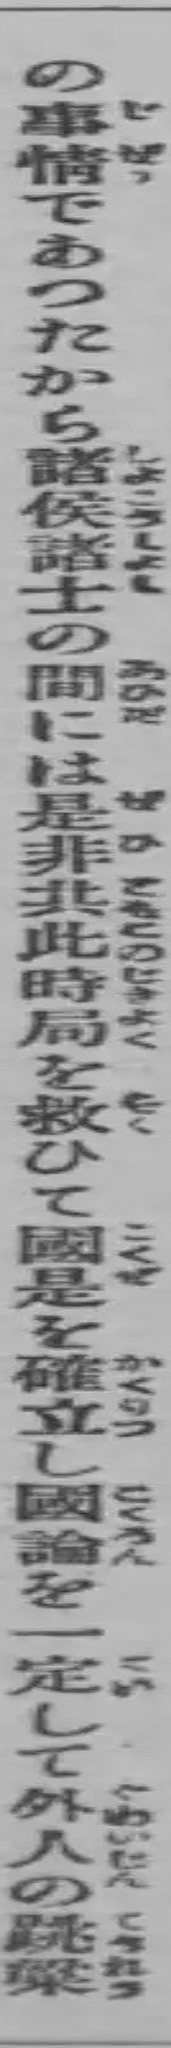の事情であつたから諸侯諸士の間には是非共此時局を救ひて国是を確立し国論を一定して外人の跳梁
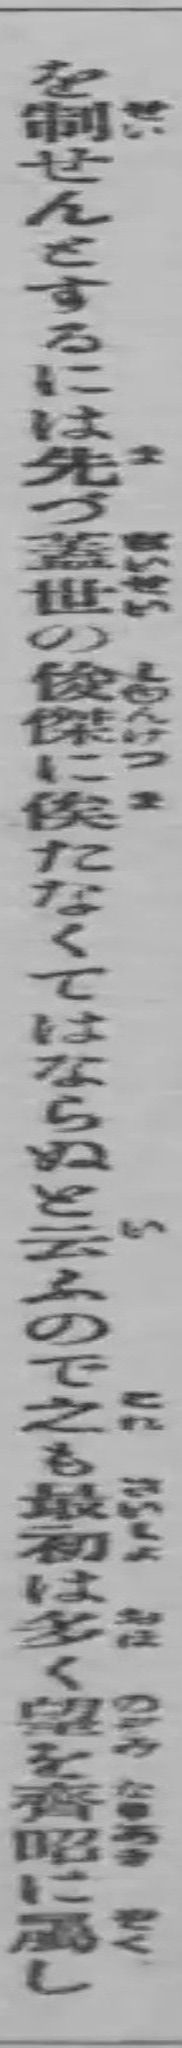を制せんとするには先づ蓋世の俊傑に俟たなくてはならぬと云ふので之も最初は多く望を斉昭に属し
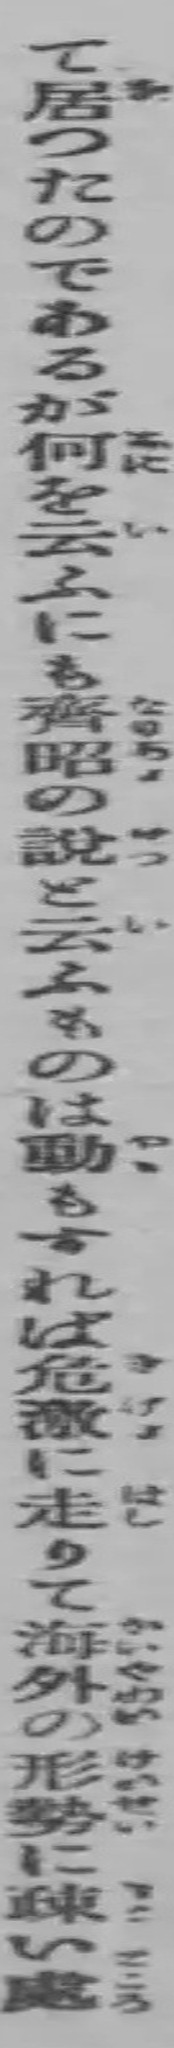て居つたのであるが何を云ふにも斉昭の説と云ふものは動もすれば危激に走りて海外の形勢に疎い処
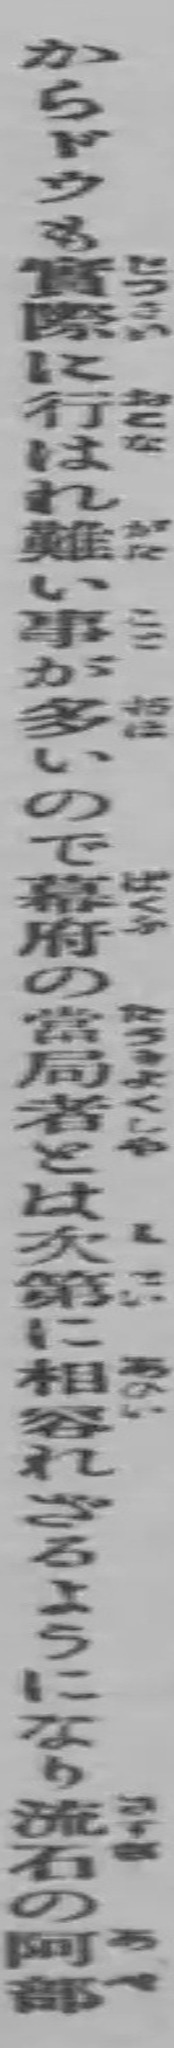からドウも実際に行はれ難い事が多いので幕府の当局者とは次第に相容れざるようになり流石の阿部
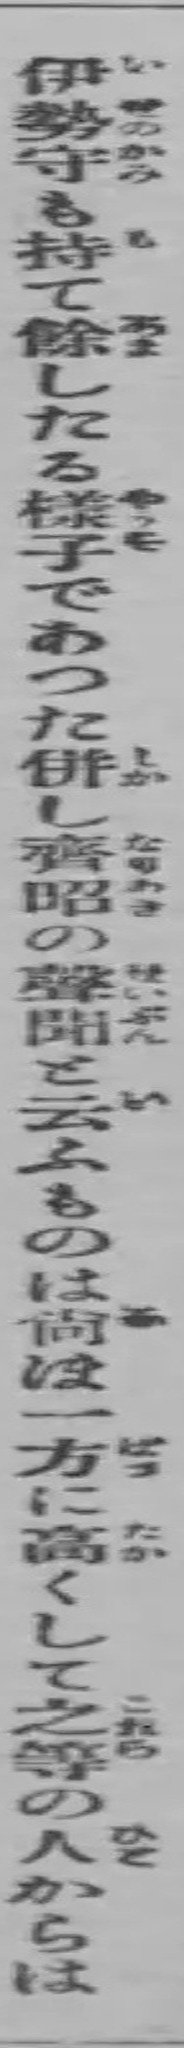伊勢守も持て余したる様子であつた併し斉昭の声聞と云ふものは尚ほ一方に高くして之等の人からは
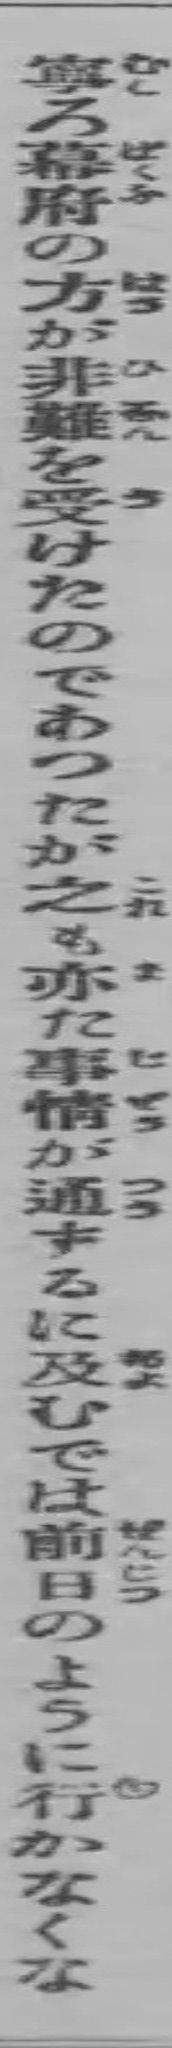寧ろ幕府の方が非難を受けたのであつたが之も亦た事情が通ずるに及むでは前日のように行かなくな
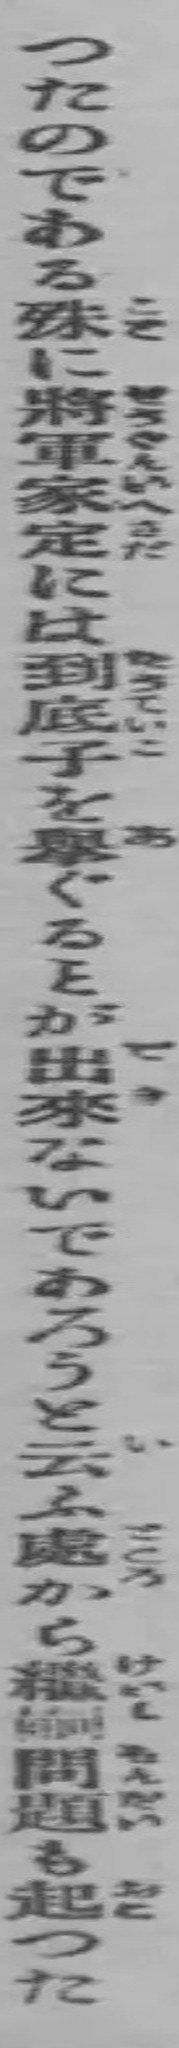つたのである殊に将軍家定には到底子を挙ぐることが出来ないであろうと云ふ処から継嗣問題も起つた

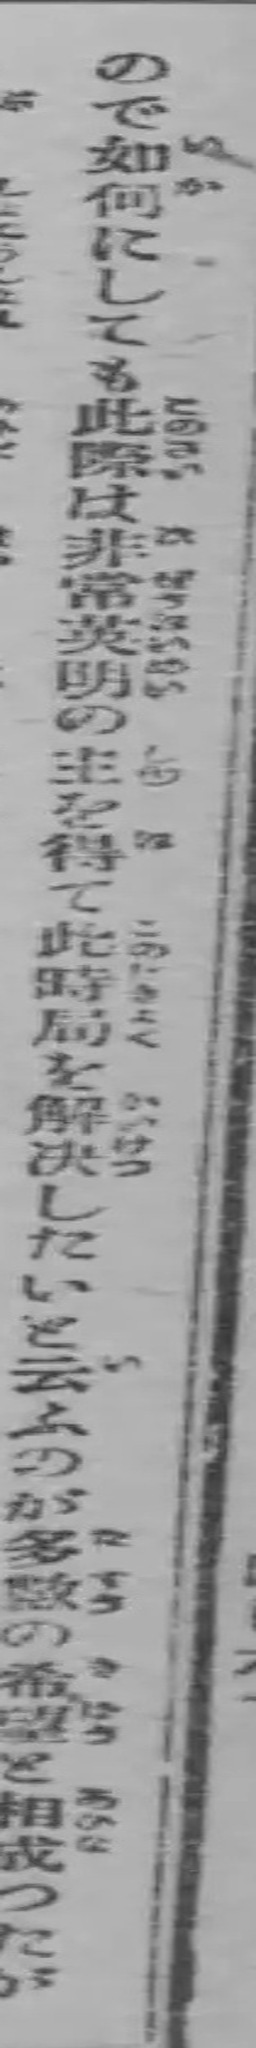ので如何にしても此際は非常英明の主を得て此時局を解決したいと云ふのが多数の希望と相成つたが
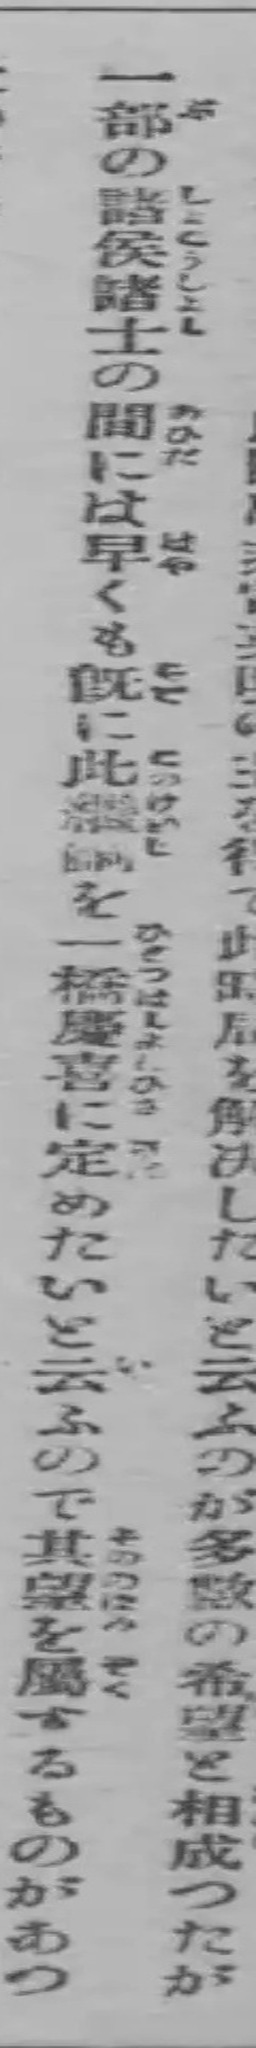一部の諸侯諸士の間には早くも既に此継嗣を一橋慶喜に定めたいと云ふので其望を属するものがあつ
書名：豊橋市史談
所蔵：国立国会図書館 National Diet Library, JAPAN
